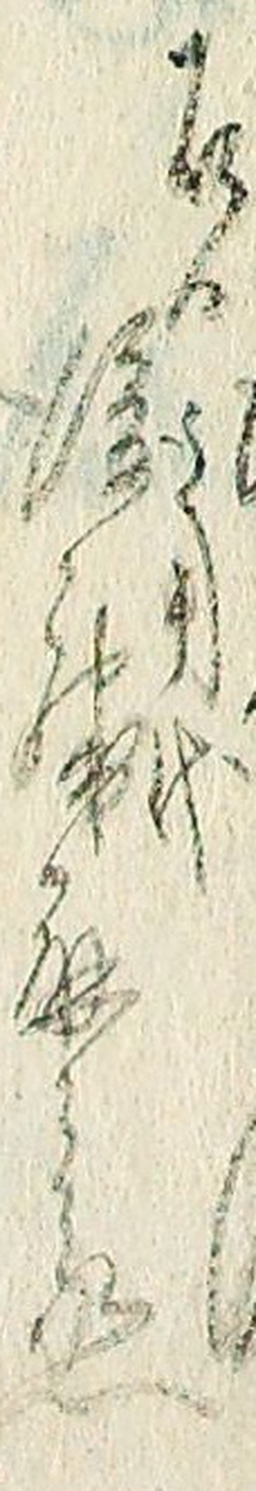後藤麻之丞
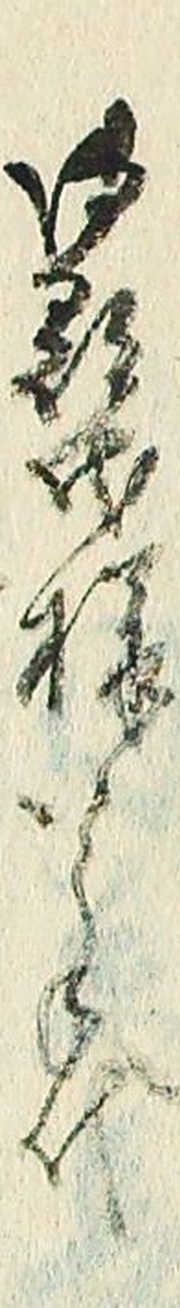御郡代様御手代
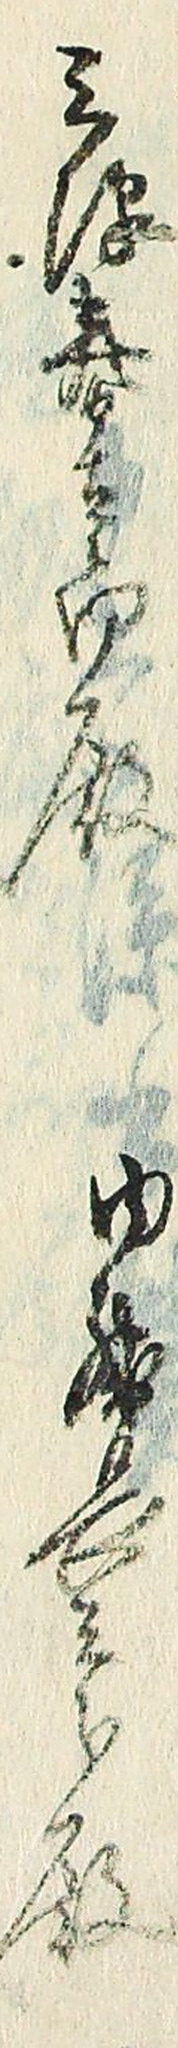三沢春太郎殿内藤長三郎殿

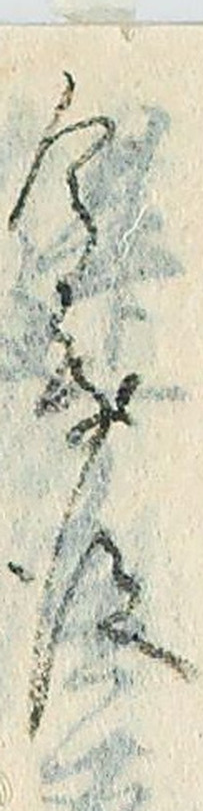今度従
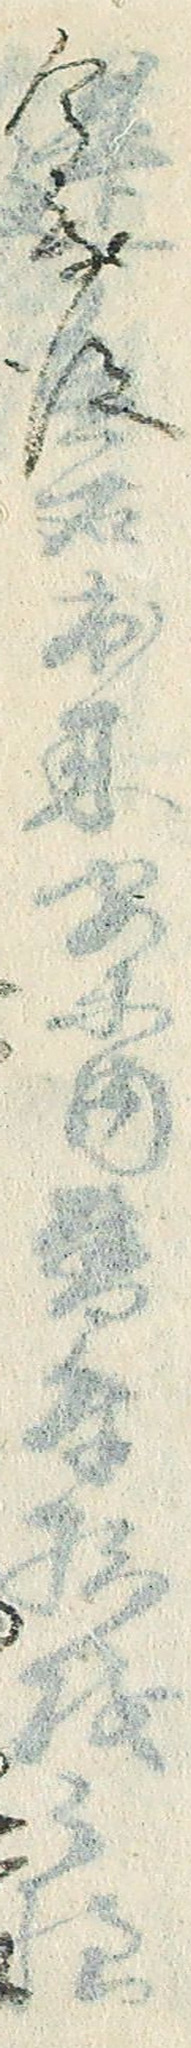今度従
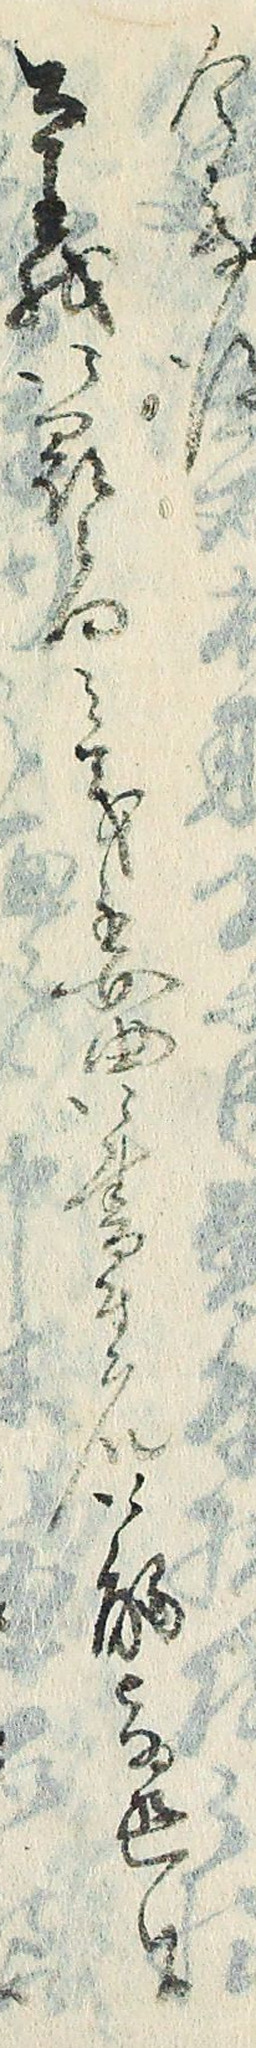公義御尋者之義委曲御書付を以御触被為遊候
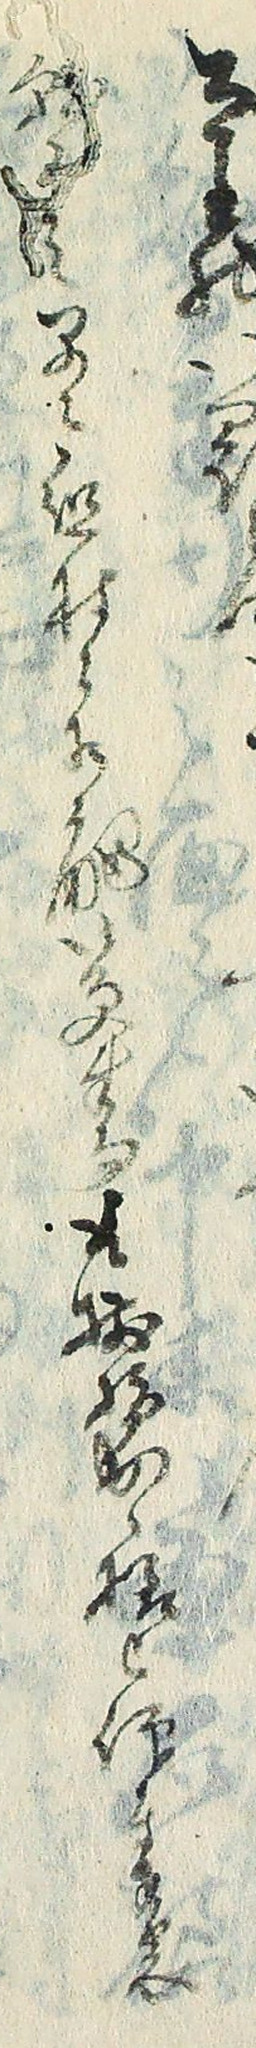就而は早々組村々相触御受書取揃指出候様被仰付奉畏
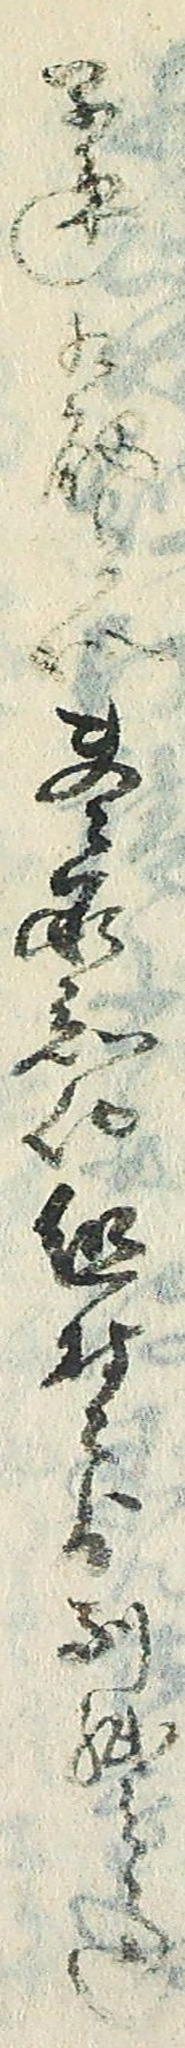早速相触候処夫々承知仕組村々ゟ別紙之通
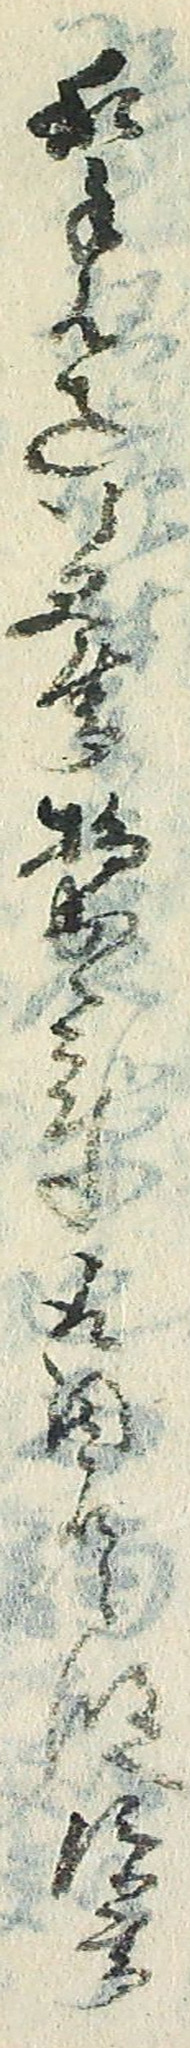私手元迄御受書指出候に付取調右之段添書
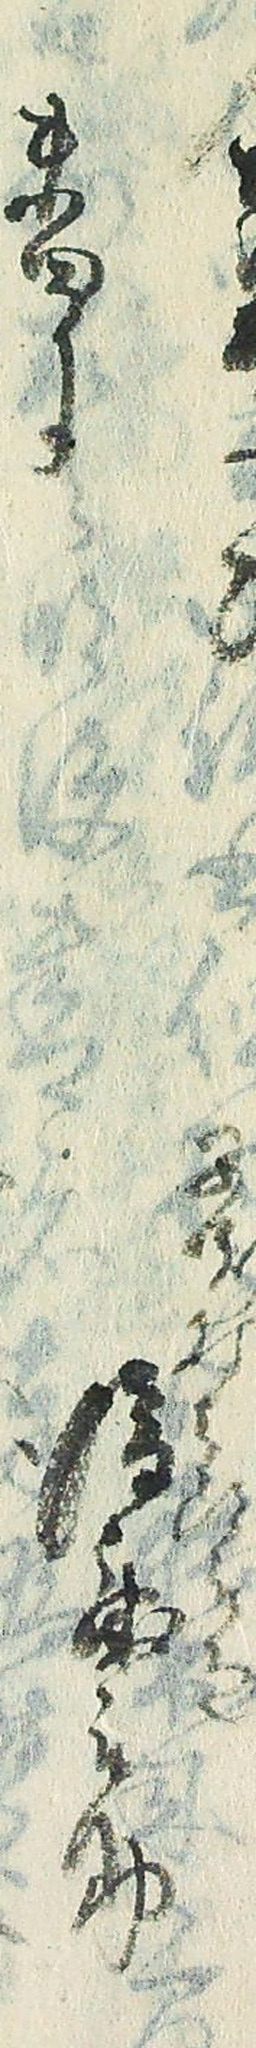未四月後藤麻之丞
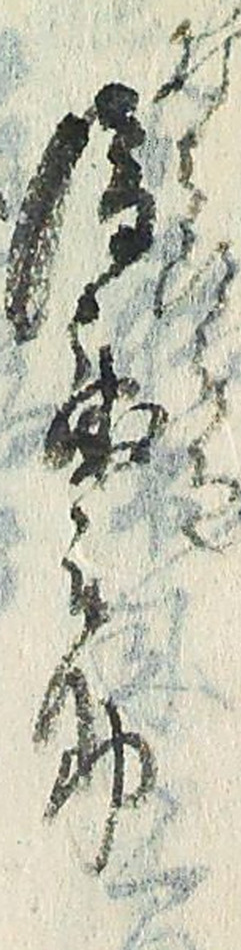後藤庄助
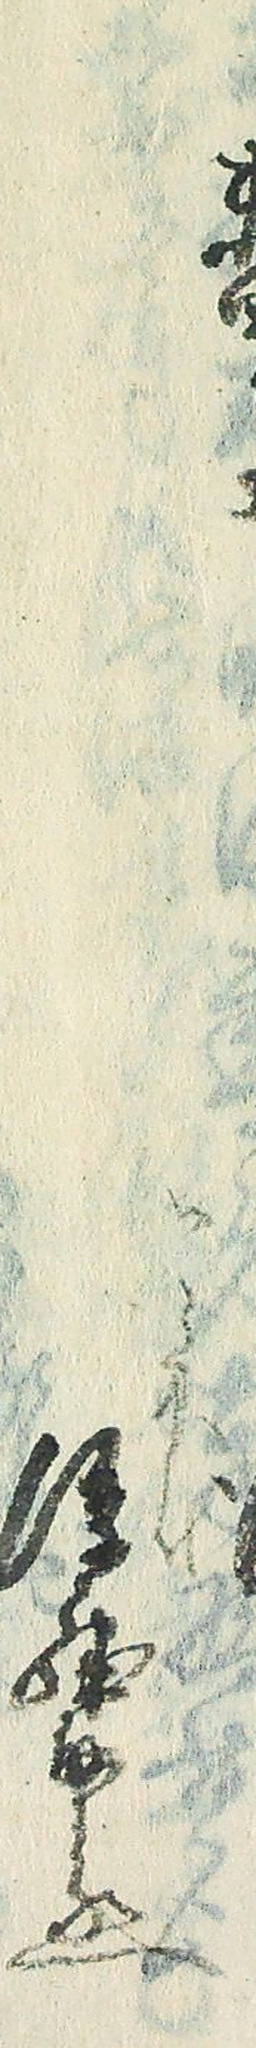後藤庄助
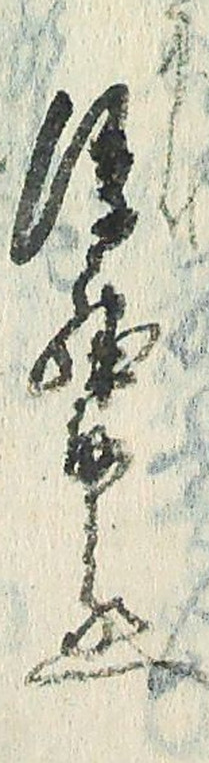後藤庄助
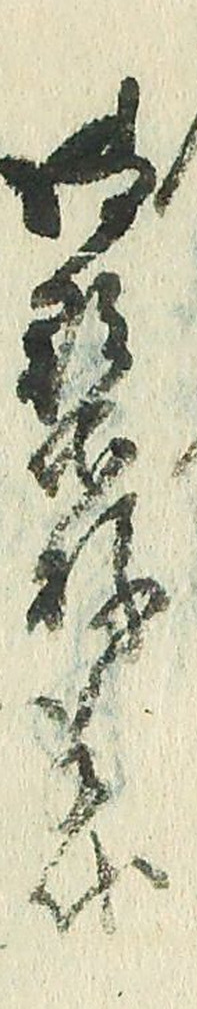御郡代様御手代
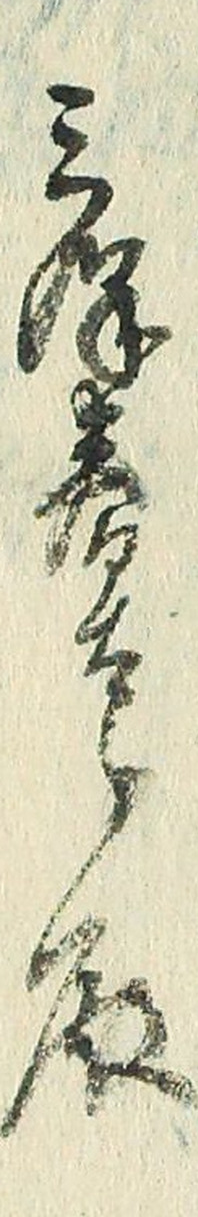三沢春太郎殿
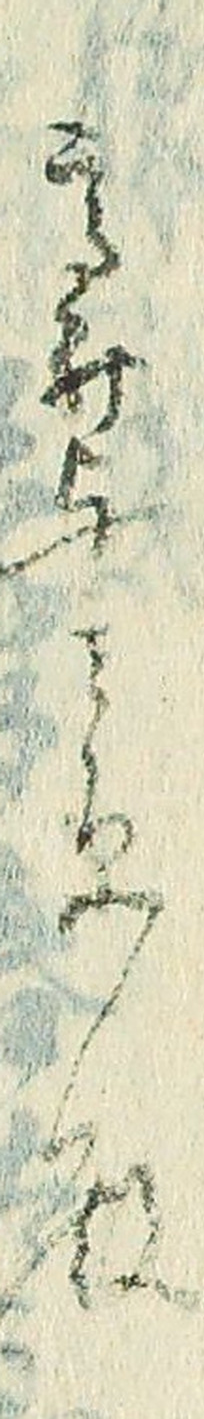高井与三兵衛殿
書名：諸御用御□受書控
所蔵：鳴門教育大学 Naruto University of Education
